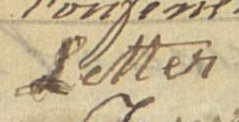Letter
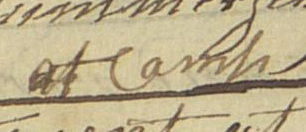at Camp
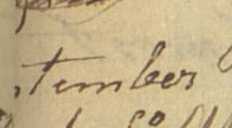-tember
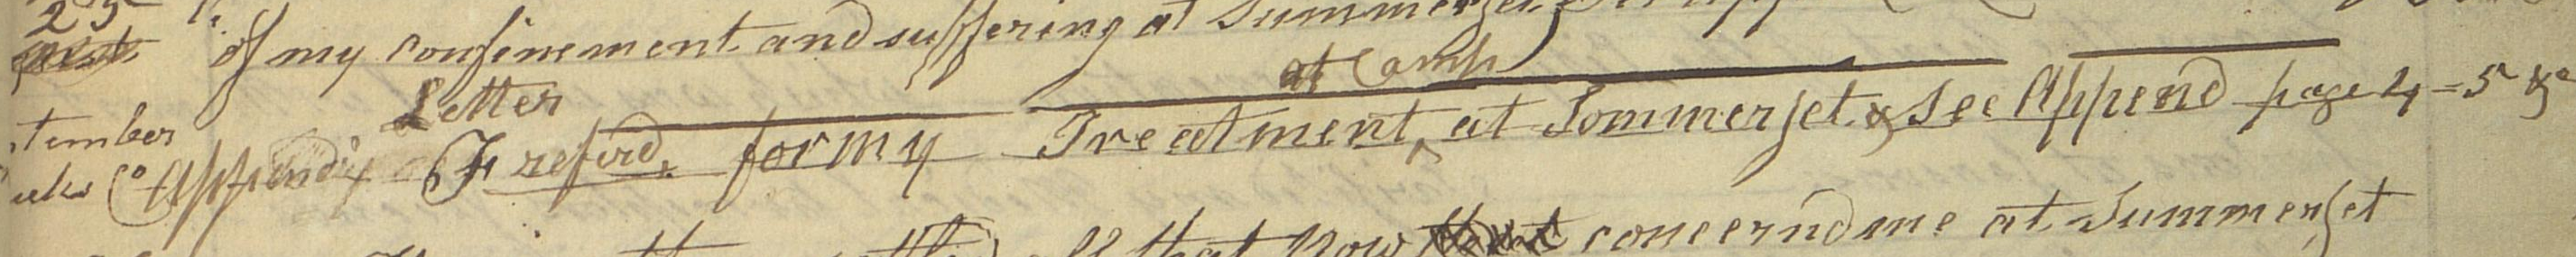-ales (Appendix F referd for my Treatment ^ at Summerset, see Append page 4-5 &c
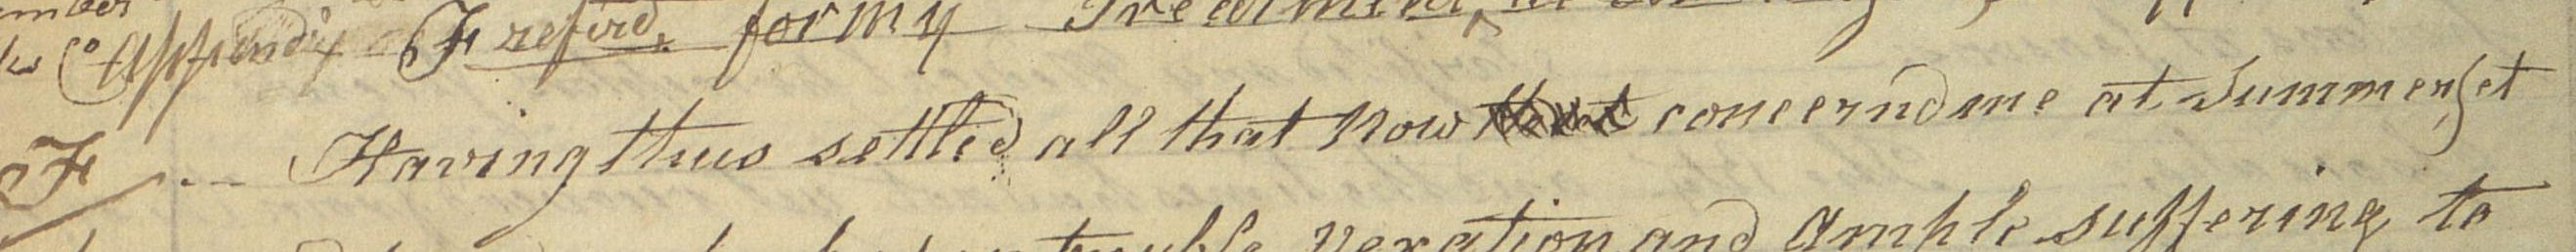F Having thus settled all that now that concernd me at Summerset
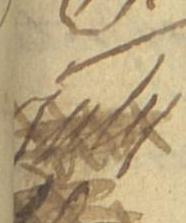July
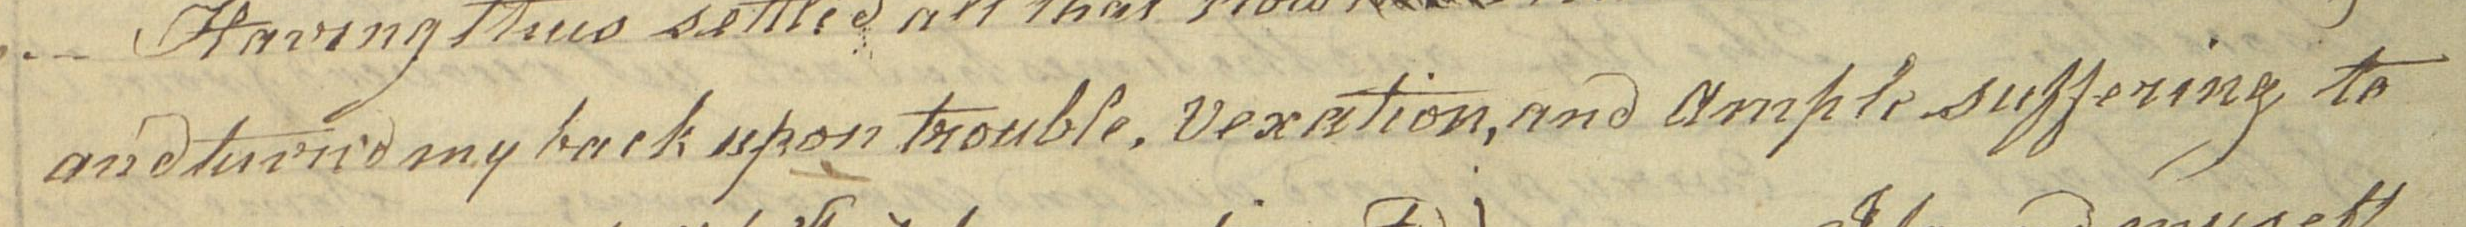and turn'd my back upon trouble, vexation, and Ample suffering to
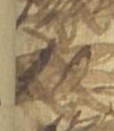-76
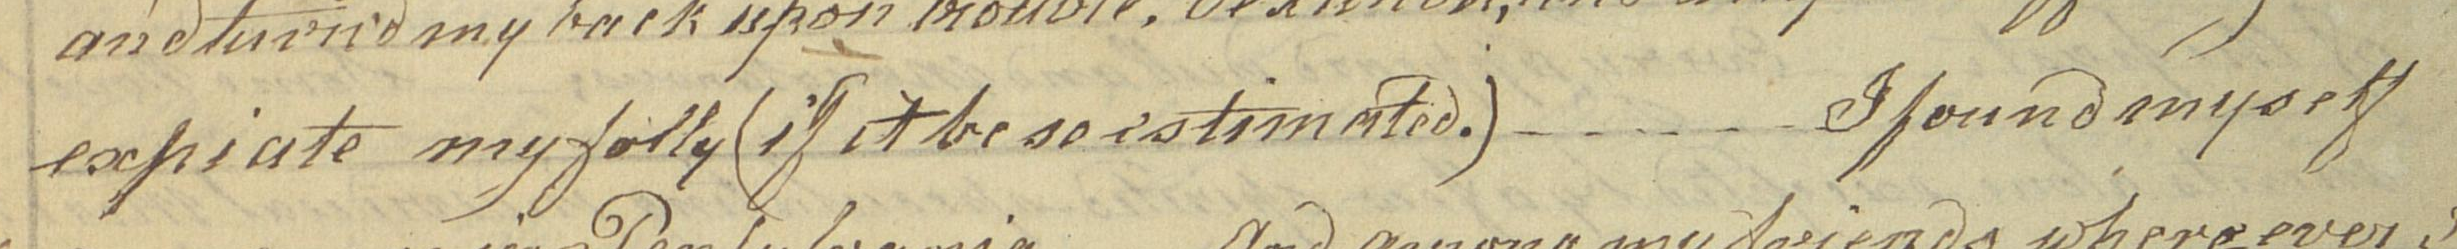expiate my folly (if it be so estimated.) I found myself
